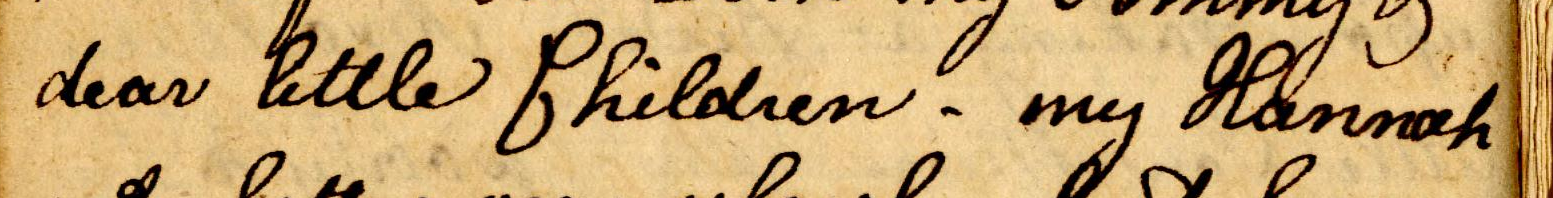dear little Children- my Hannah
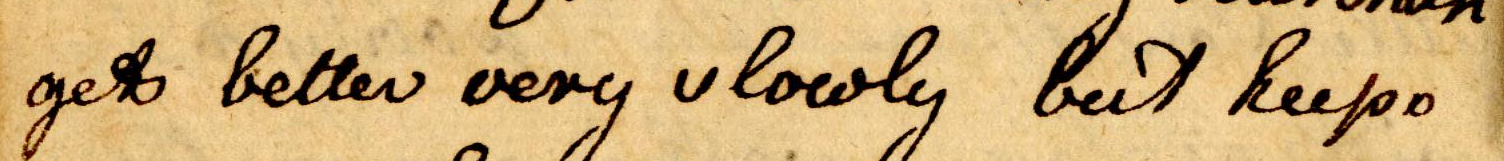gets better very slowly but keeps
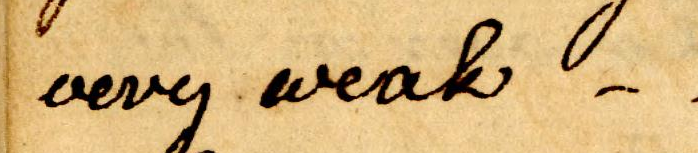very weak-
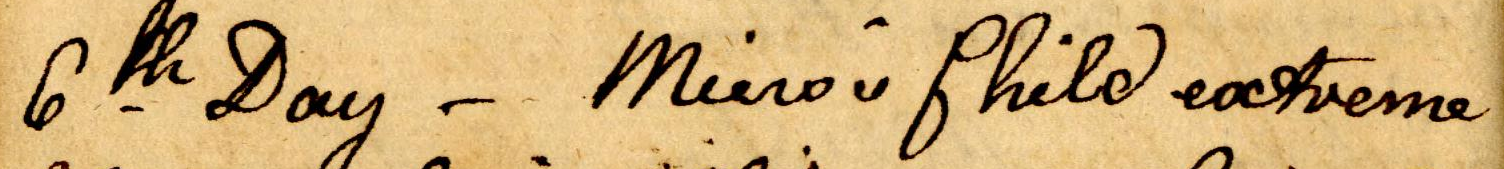6^th Day- Miers's Child extreme
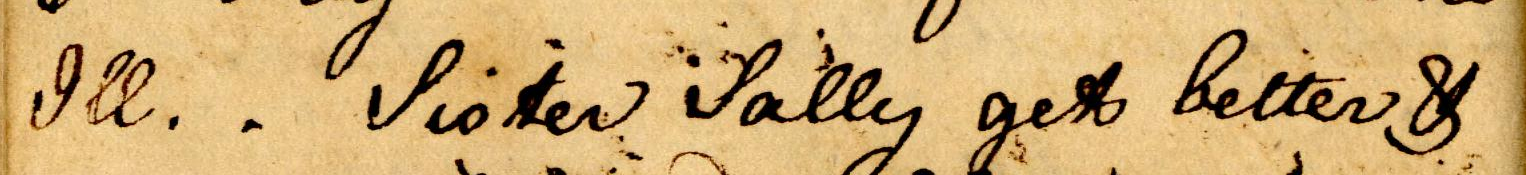Ill- Sister Sally gets better &
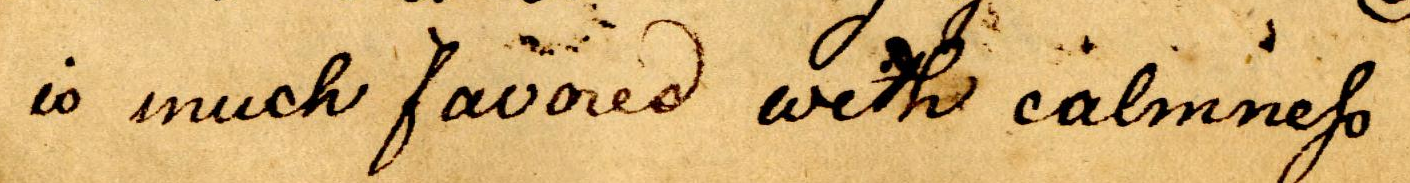to much favored with calmness
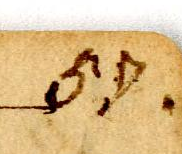57
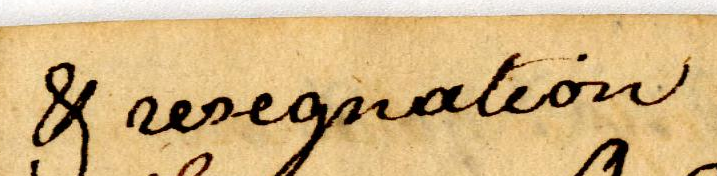& resegnation
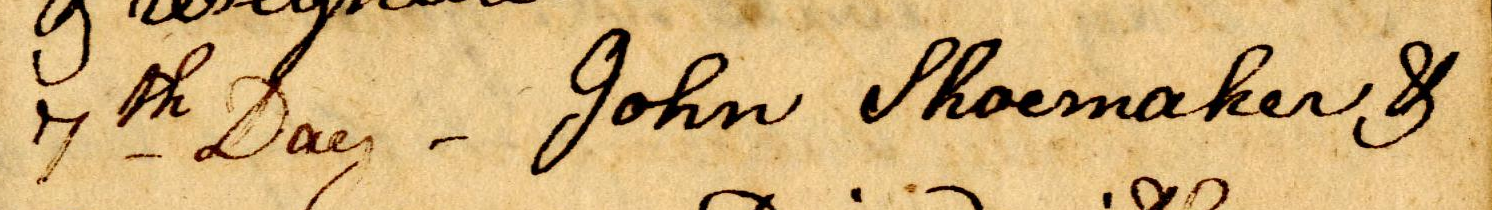7^th Day- John Shoemaker, &
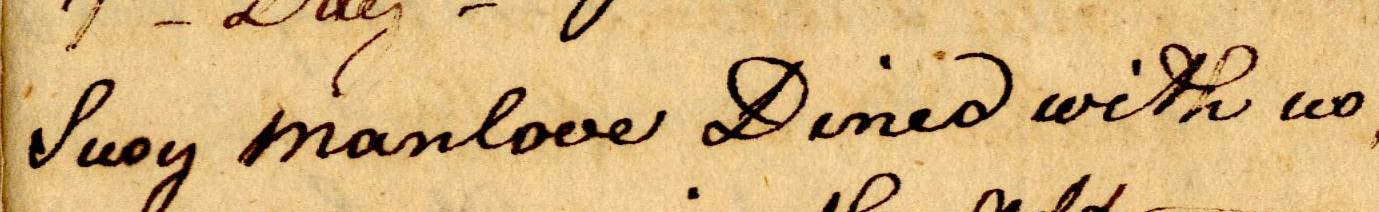Susy Manlove Dined with us,
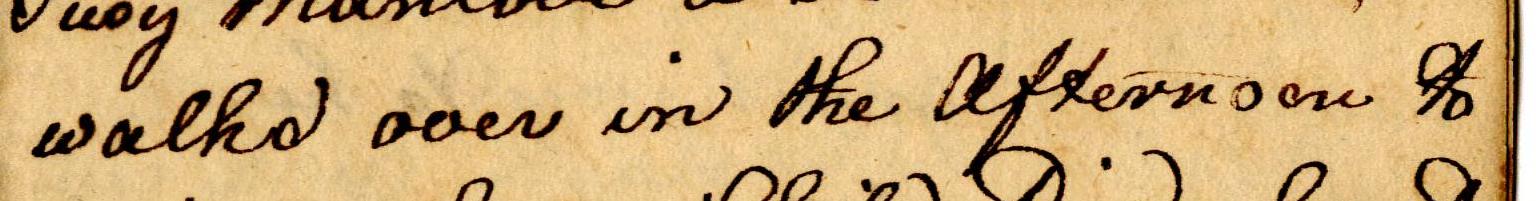walkd over in the Afternoon to
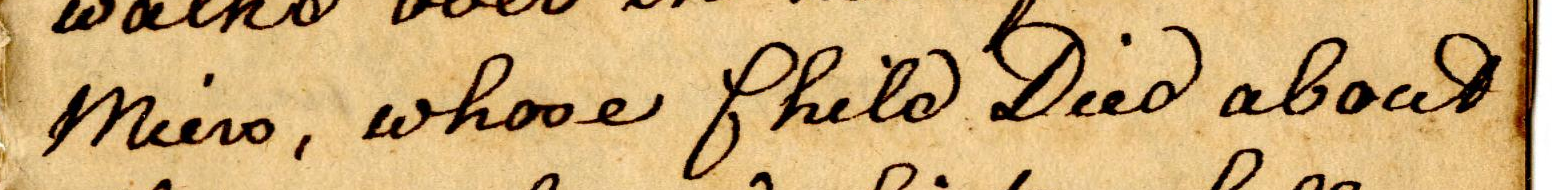Miers, whose Child Died about
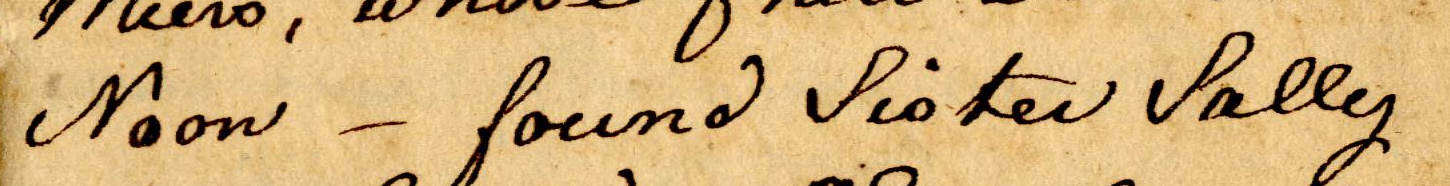Noon- found Sister Sally
